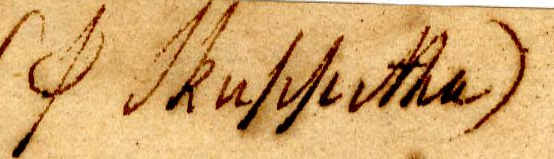(per Skeppetha)
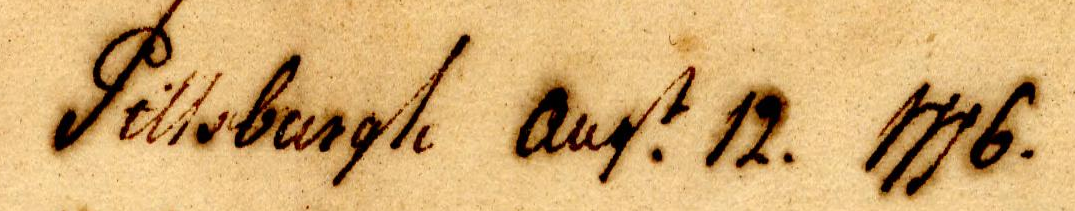Pittsburgh Aug^t. 12. 1776.
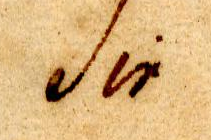Sir
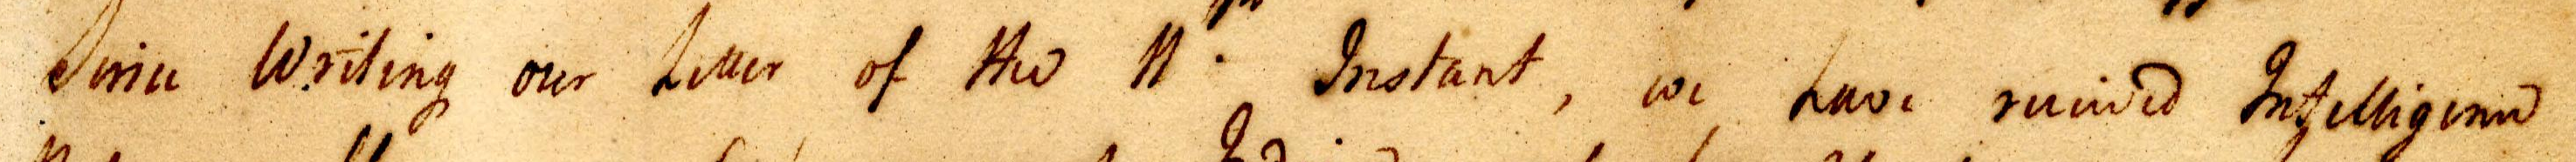Since Writing our Letter of the 11^th. Instant, we have received Intelligence
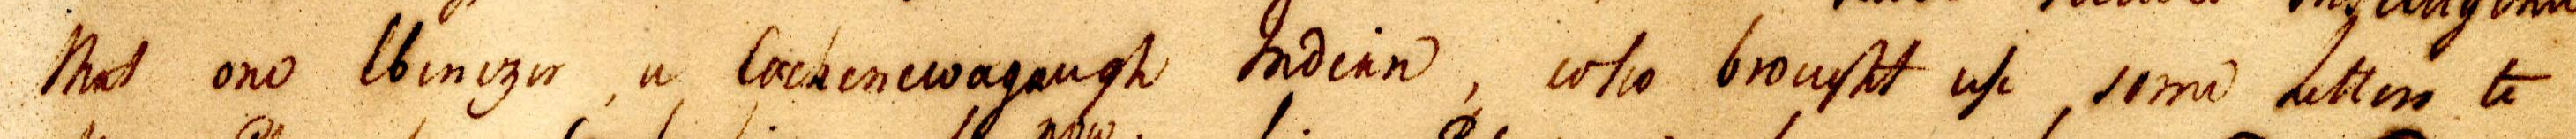that one Ebinizer a Cockenewagaugh Indian, who brought up some Letters to
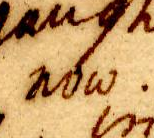now.
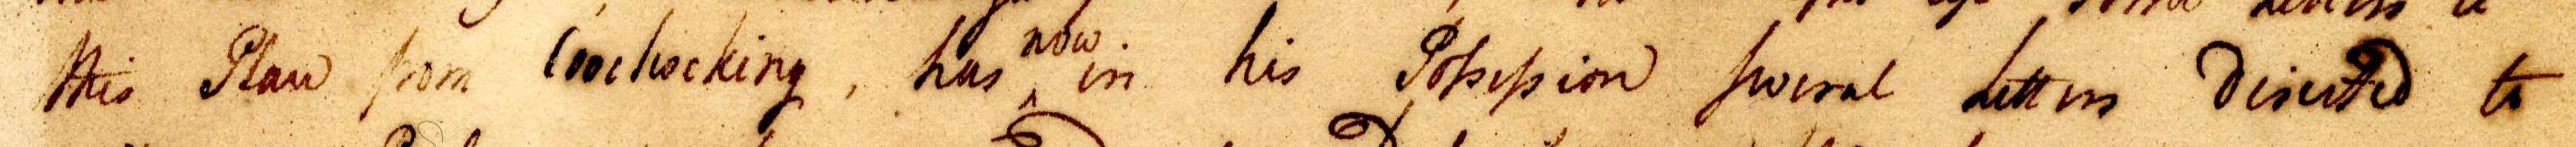this Place from Coochocking, has ^ in his Possession several Letters directed to
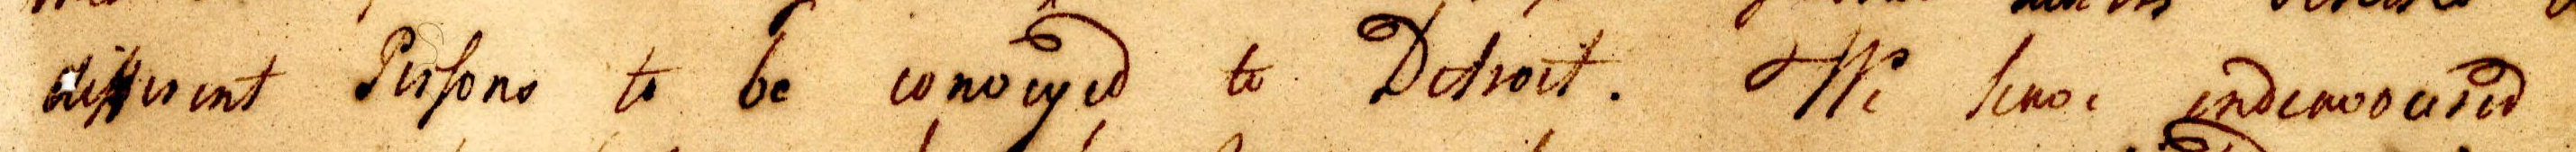different Persons to be conveyed to Detroit. We have indeavoured
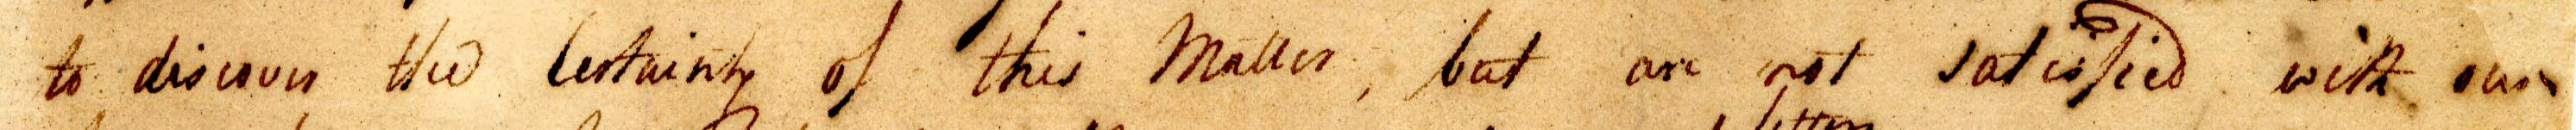to discover the certainty of this Matter, but are not satisfied with our
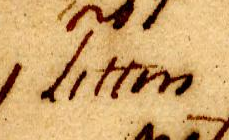Letters
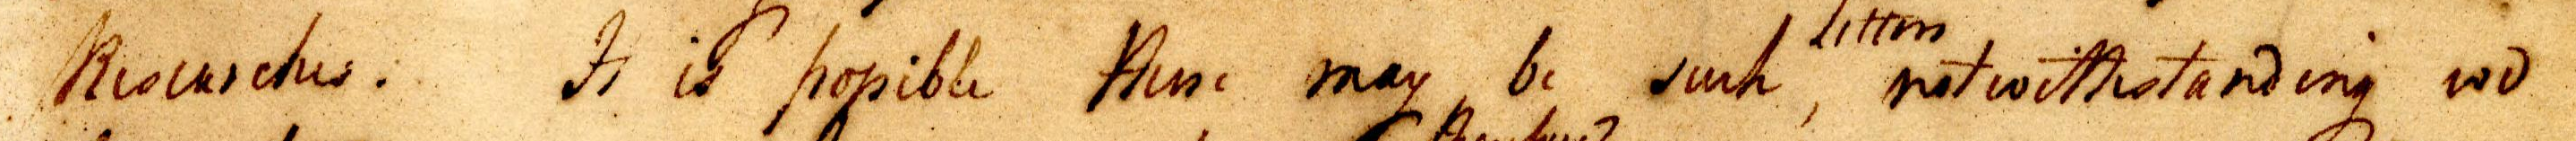Researches. Is is possible there may be such ^, notwithstanding we
